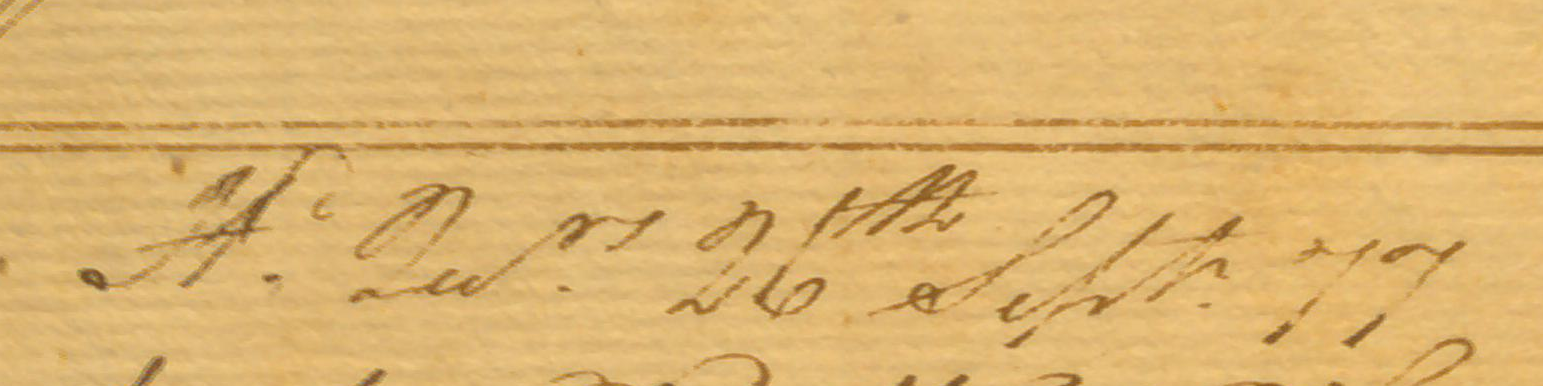H^d. Qu^rs. 26^th Sept^r. 77
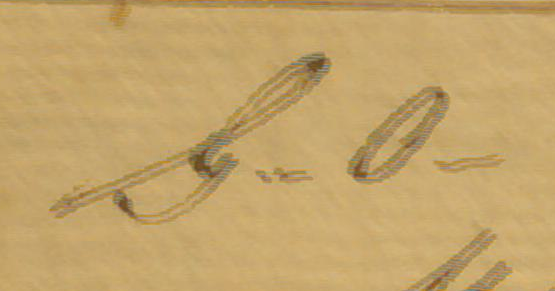G.O-
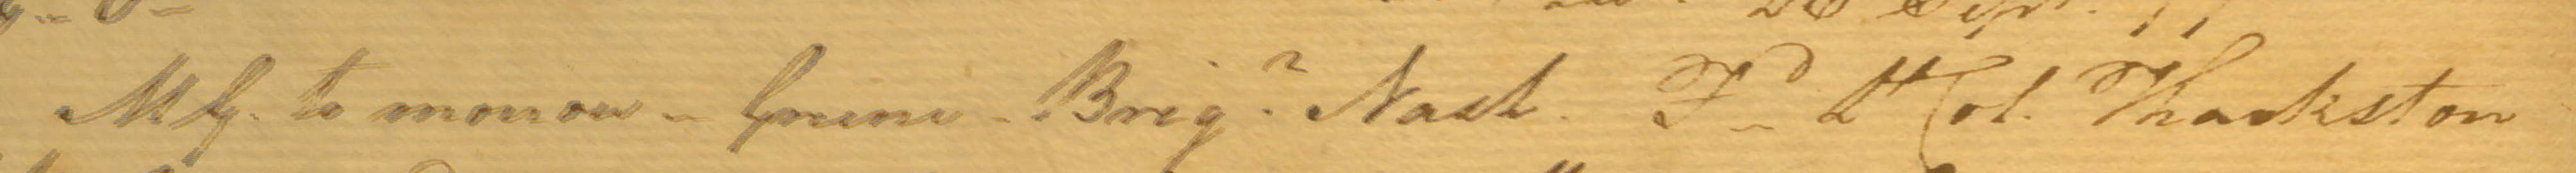M.G. to morrow. Greene. Brig^r. Nash. F^d L^t Col. Thackston
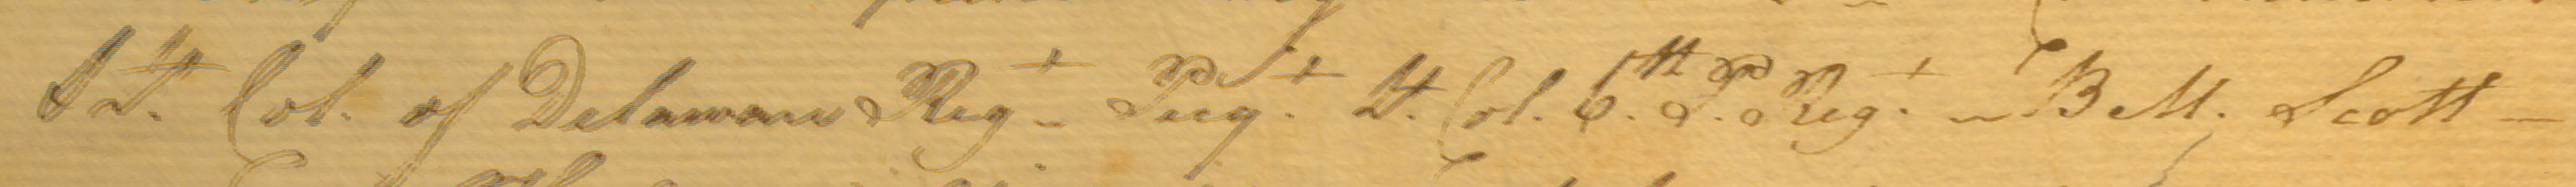& L^t. Col. of Delaware Reg^t. Picq^t. L^t. Col. 6^th. p. Reg^. - Bell. Scott-
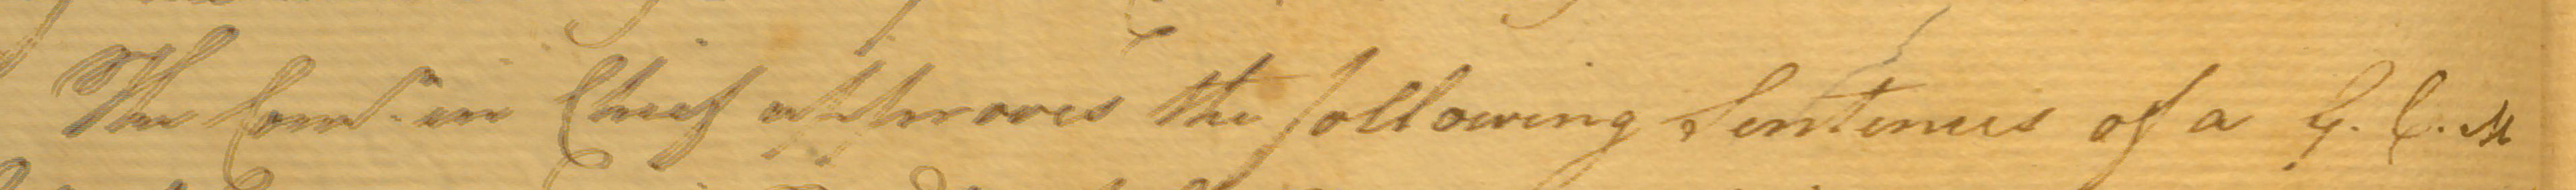The Com^r. in Chief approves the following Sentences of a G. C.M
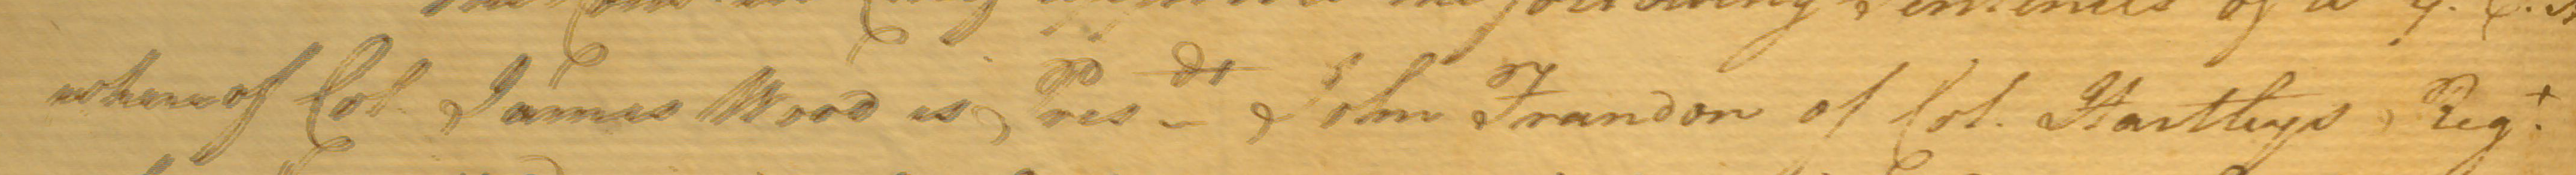whereof Col. James Wood is Pres^dt. John Frandon of Col. Hartleys Reg^t.
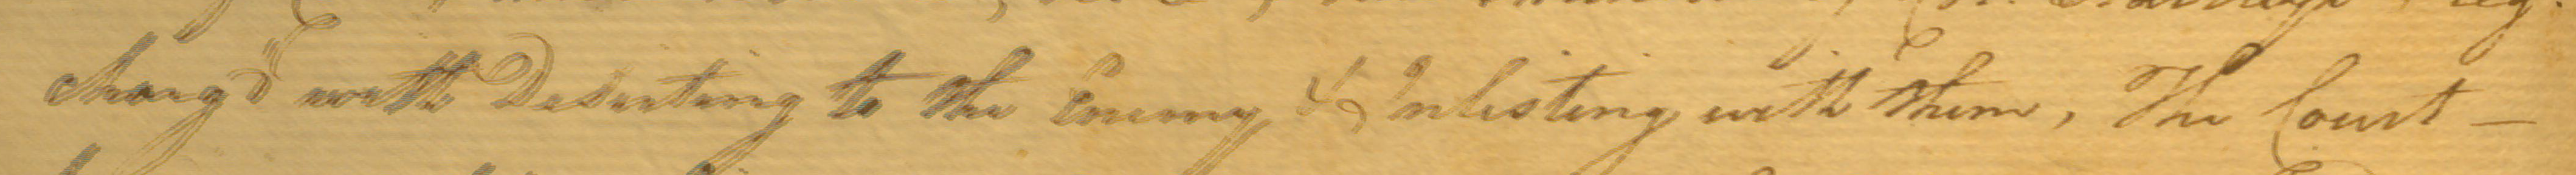chargd with Deserting to the Enemy & Inlisting with them, The Court-
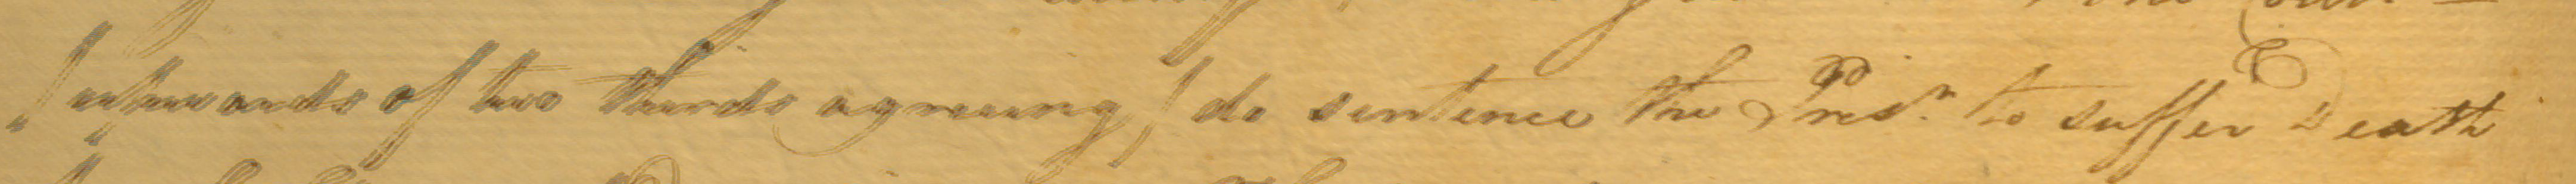/upwards of two thirds agreeing/ do sentence the Pris^r. to suffer Death
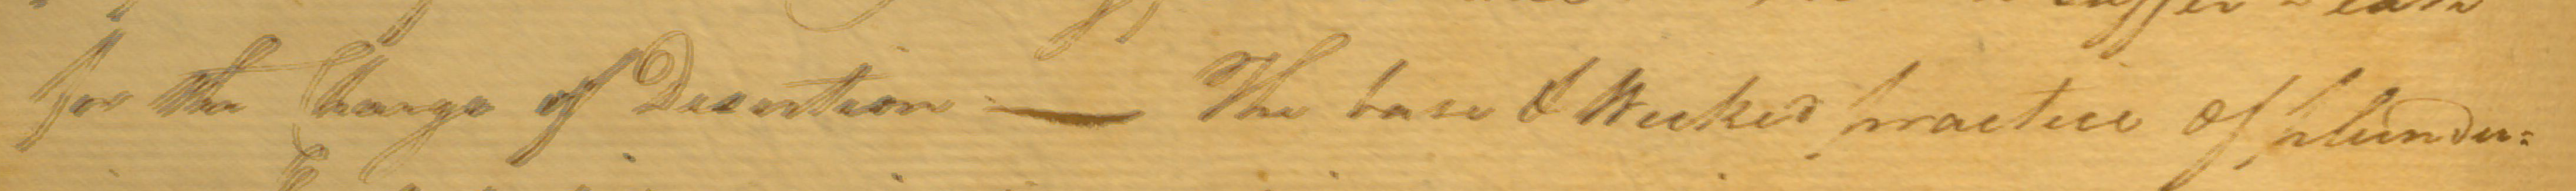for the Charge of Desertion- The base & Wicked practice of plunder-
